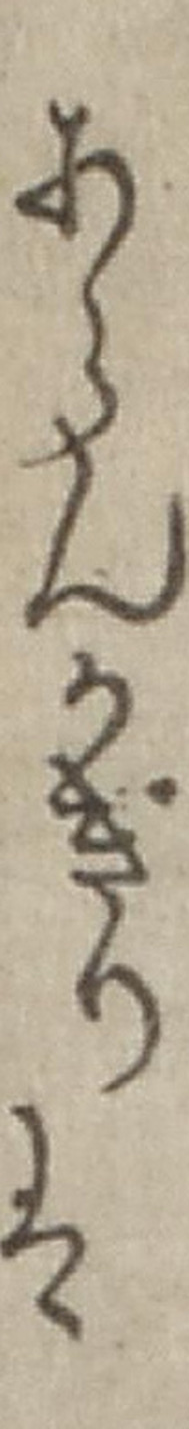あらんかぎり
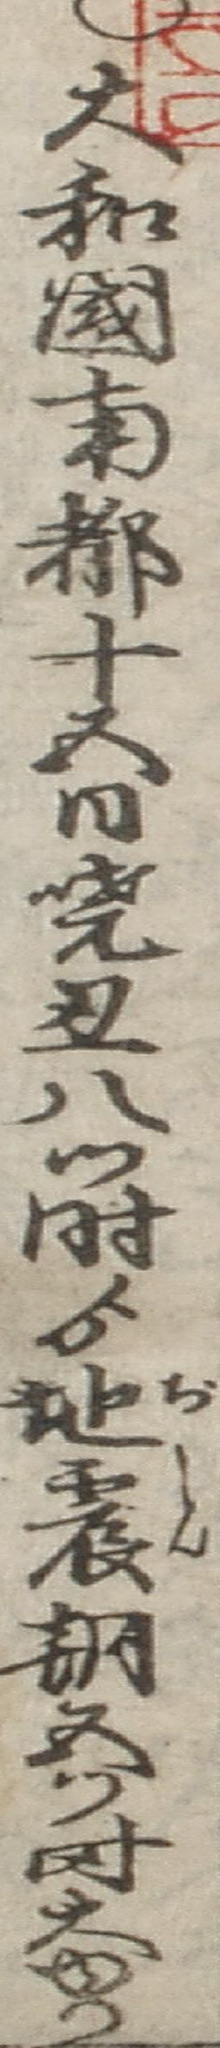○大和国南都十五日暁丑八ツ時ゟ地震朝五ツ時大ゆり
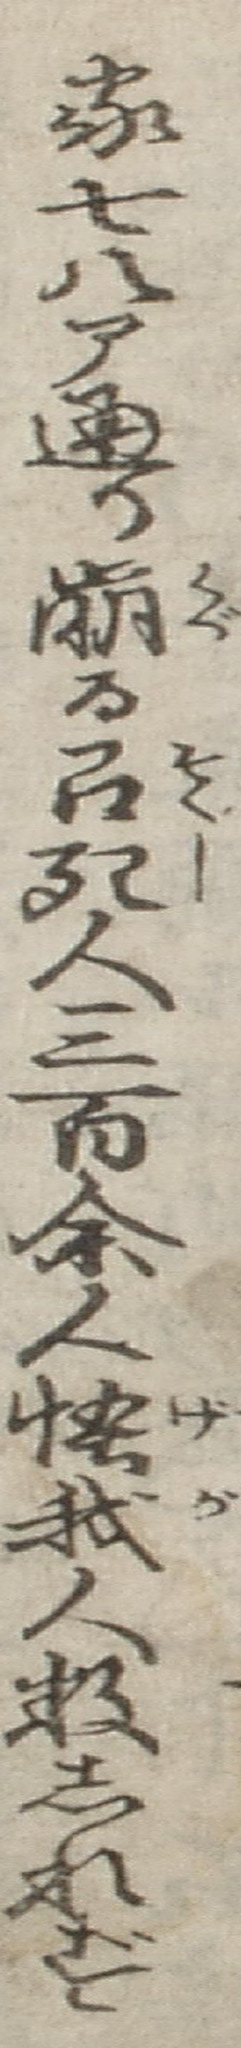家七八部通り崩る即死人三百余人怪我人数しれず
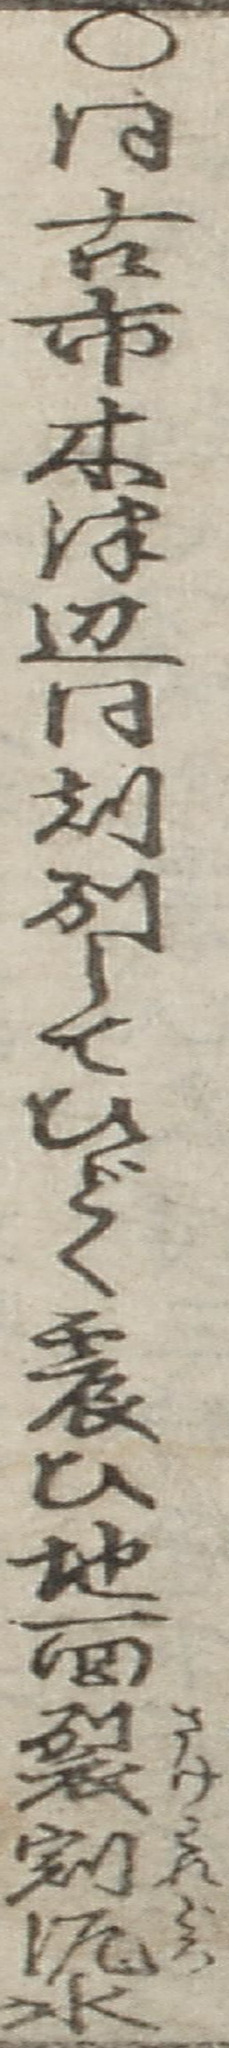○同古市木津辺同刻別してひどく震ひ地面裂割泥水
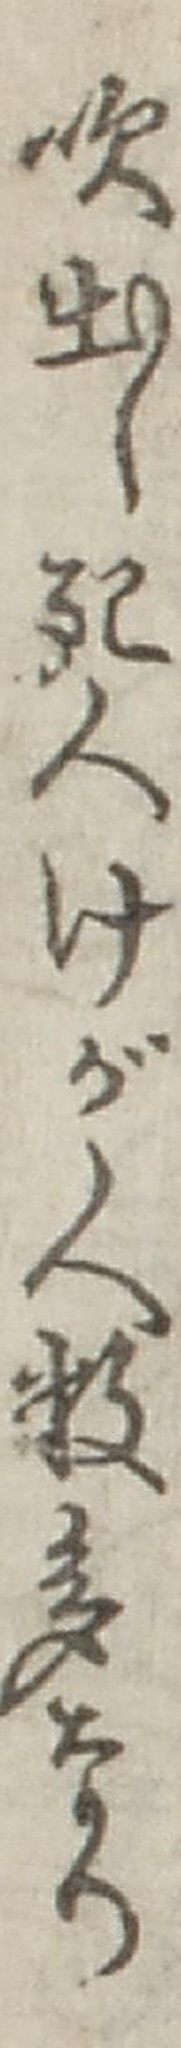吹出し死人けが人数多なり
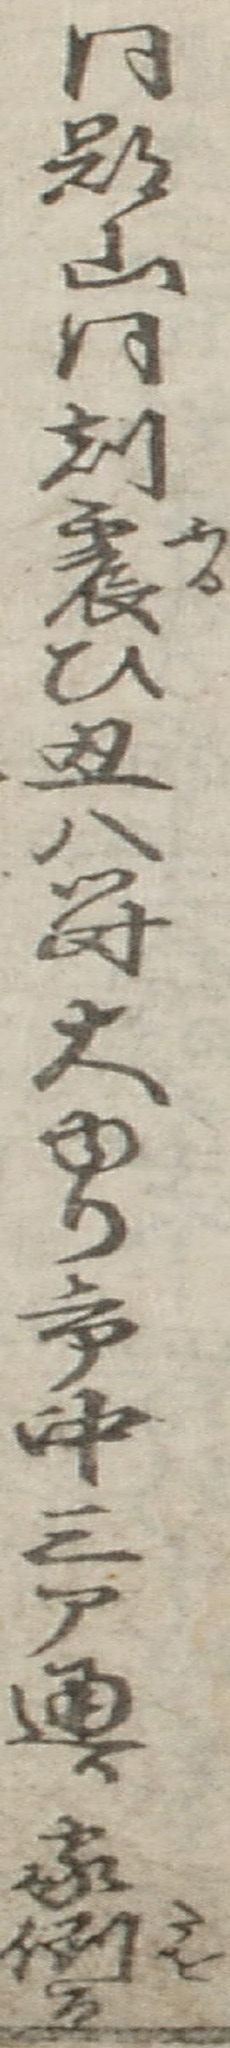同郡山同刻震ひ丑八ツ時大ゆり市中三部通り家倒る
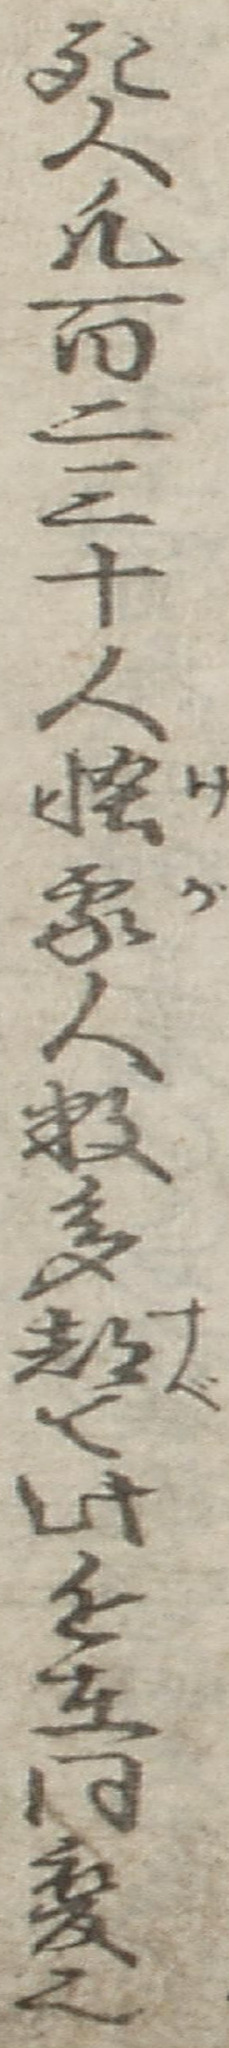死人凡百二三十人怪我人数多都て此近在同変也
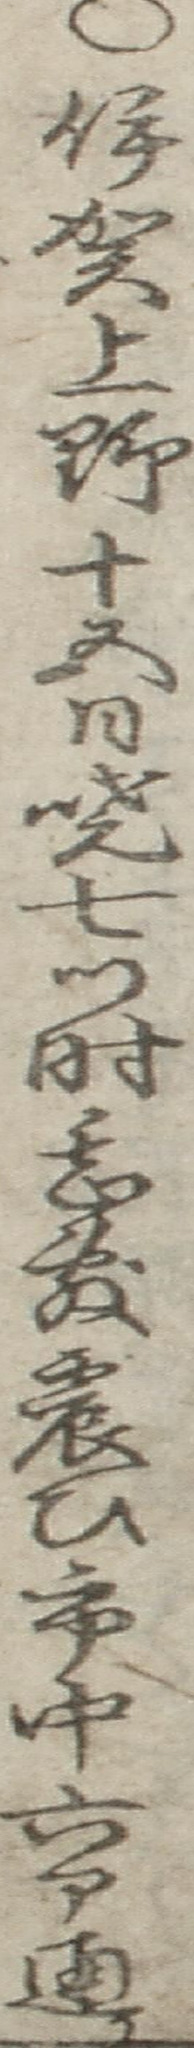○伊賀上野十五日暁七ツ時甚敷震ひ市中六部通り
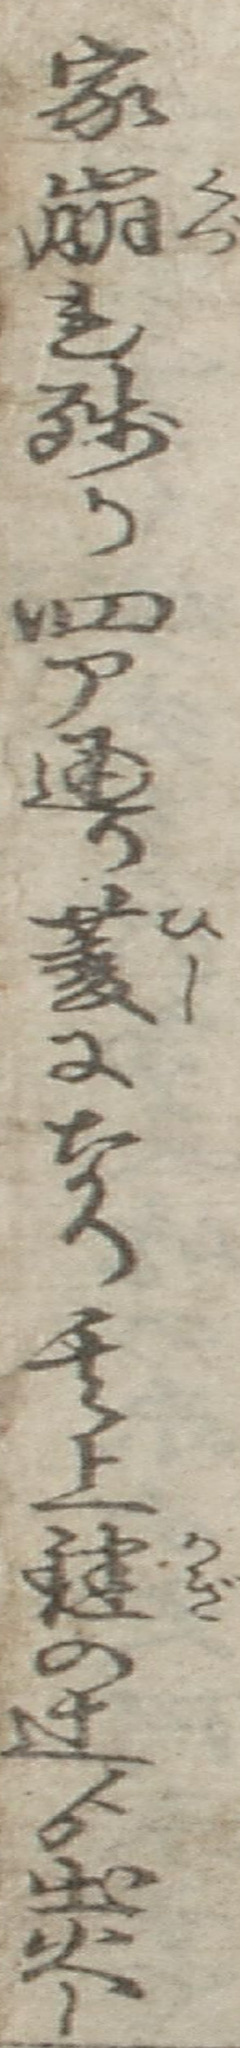家崩れ残り四部通り菱になり其上鍵の辻ゟ出火し

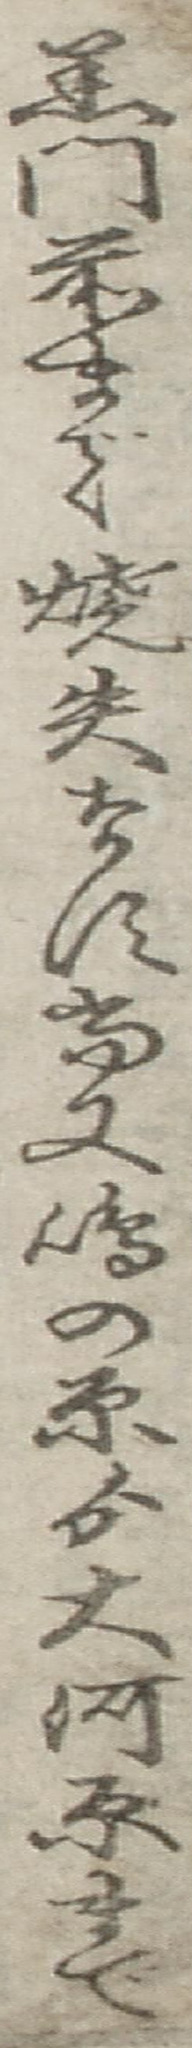黒門前まで焼失なす尚又嶋の原ゟ大河原まで
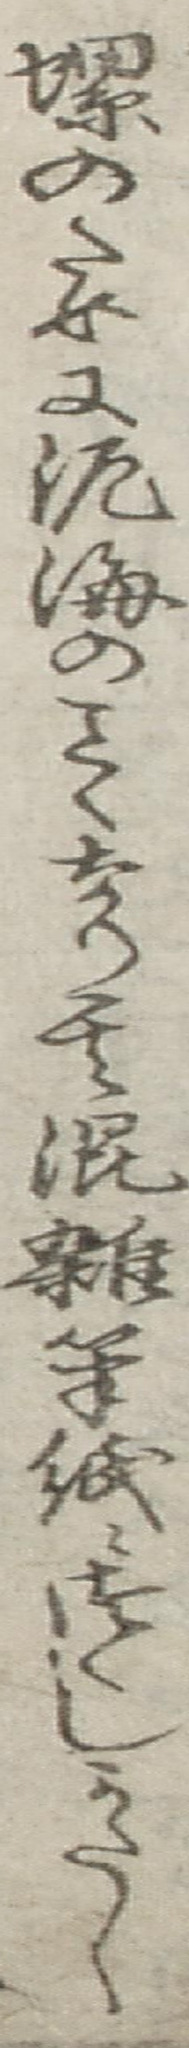螺のために泥海のことくなり其混雑筆紙につくしかたし
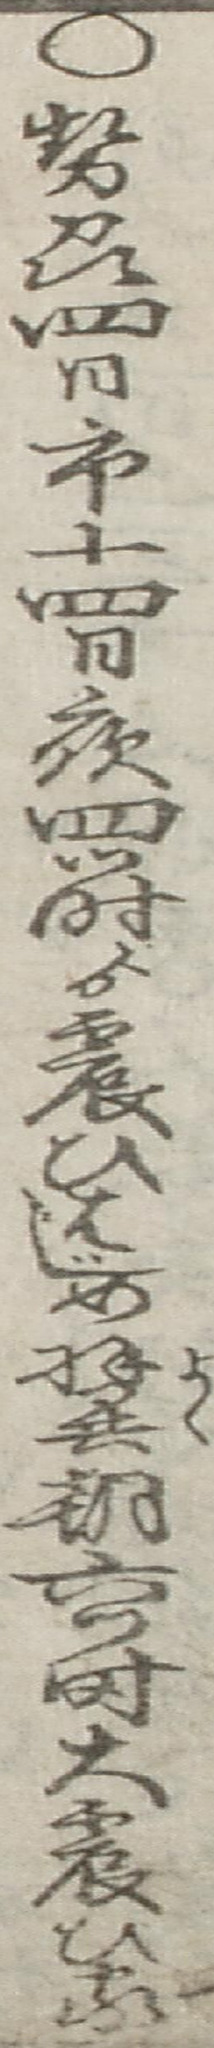○勢州四日市十四日夜四ツ時ゟ震ひはじめ翌朝六ツ時大震ひ家
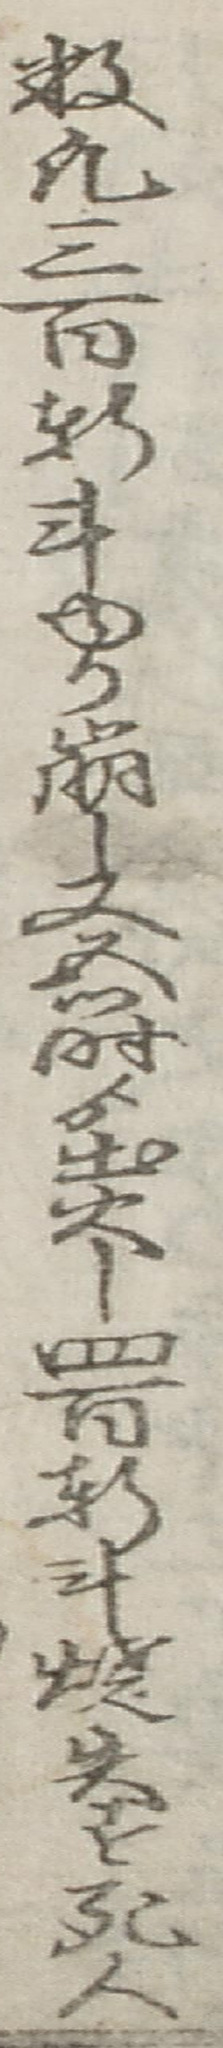数凡三百軒斗ゆり崩し又五ツ時ゟ出火し四百軒斗焼失す死人
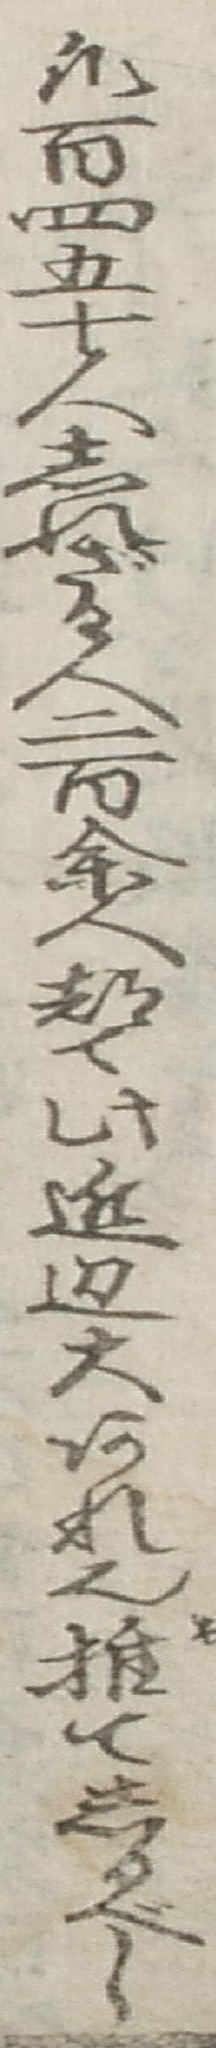凡百四五十人しれざる人二百余人都て此近辺大あれ也推てしるべし
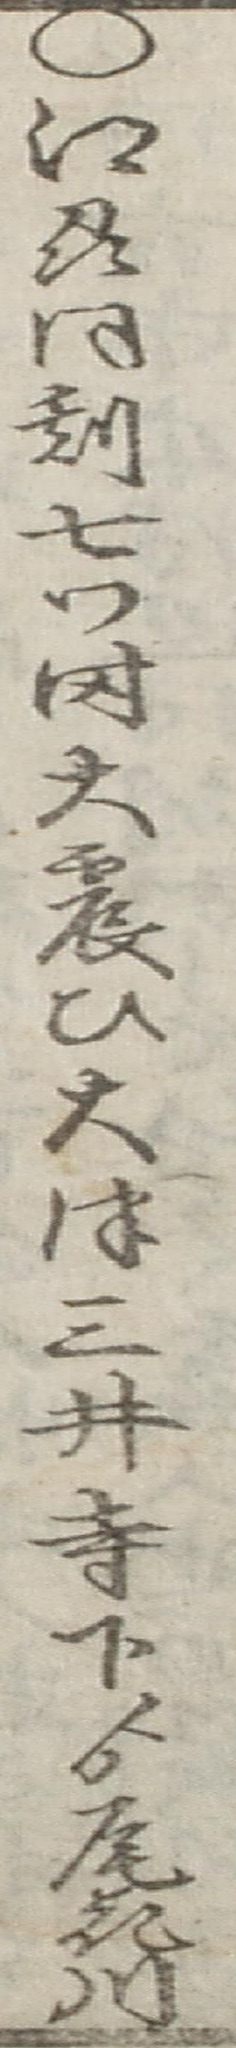○江州同刻七ツ時大震ひ大津三井寺下ゟ尾花川
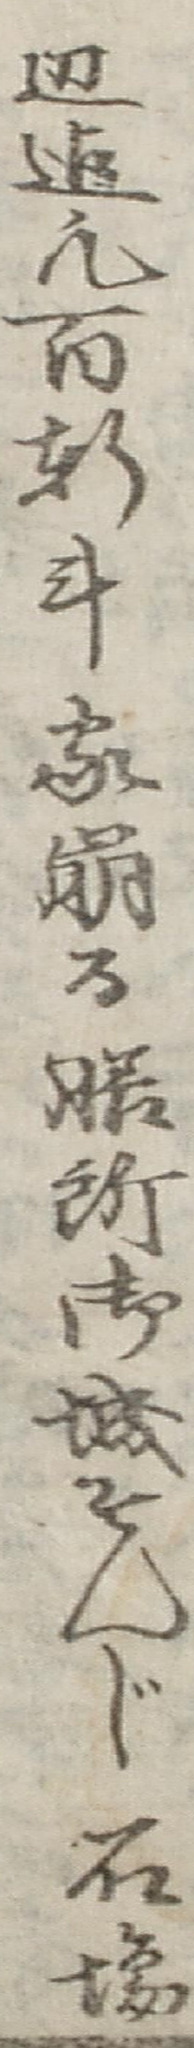辺迄凡百軒斗家崩る膳所御城そんじ石場
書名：地震世直草紙　全
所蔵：東京大学地震研究所図書室 Earthquake Research Institute Library, The University of Tokyo, JAPAN
